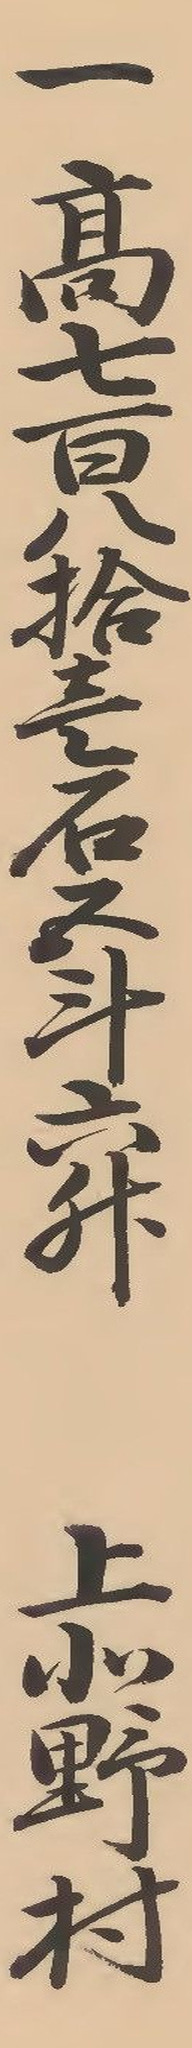一高七百八拾壱石五斗六升上北野村
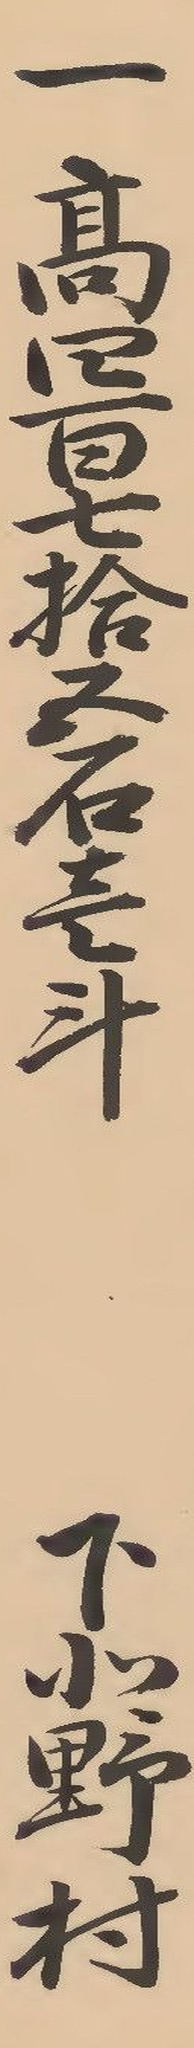一高四百七拾五石壱斗下北野村

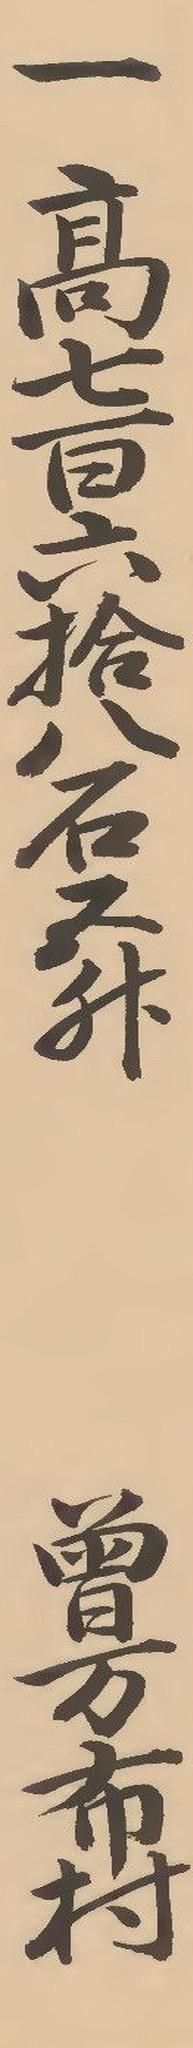一高七百六拾八石五升曽万布村
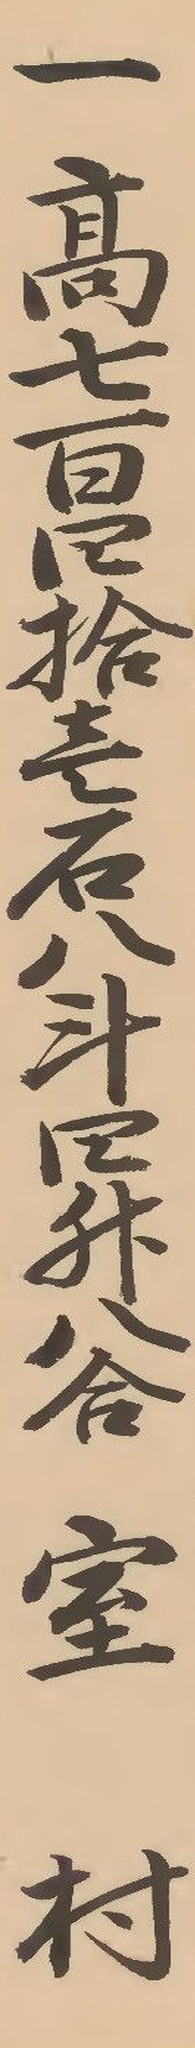一高三百四拾三石八斗四升藤島村
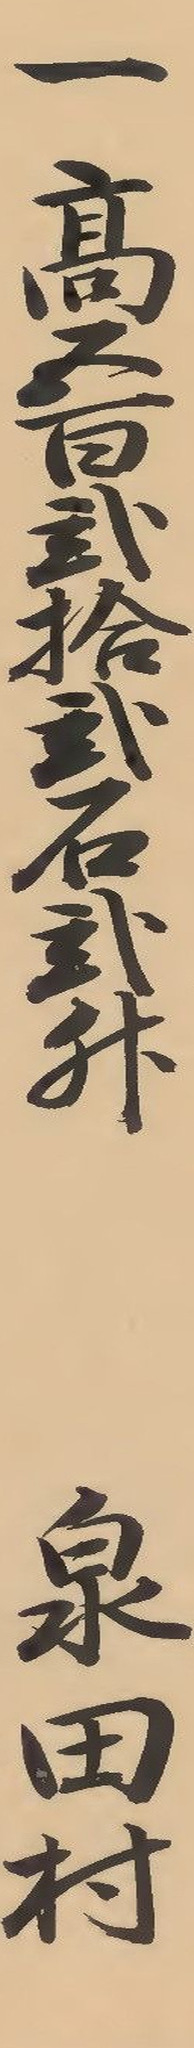一高五百弐拾弐石弐升泉田村
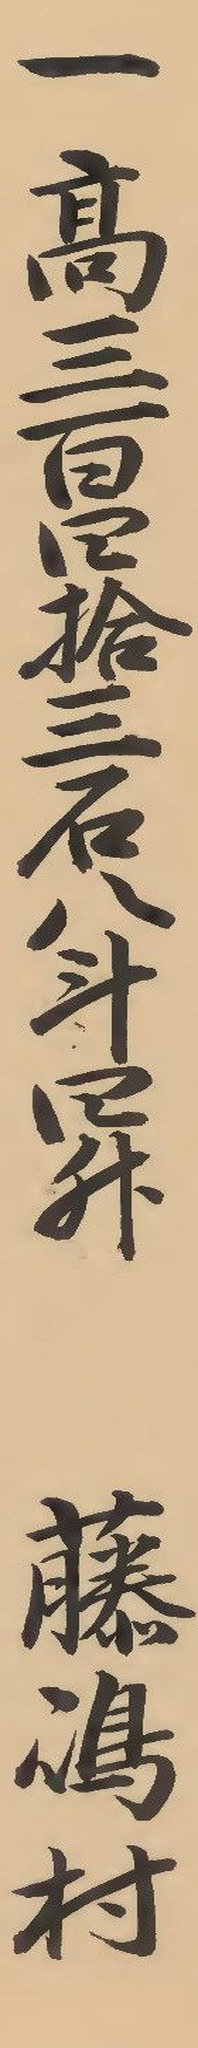一高三百四拾三石八斗四升藤島村

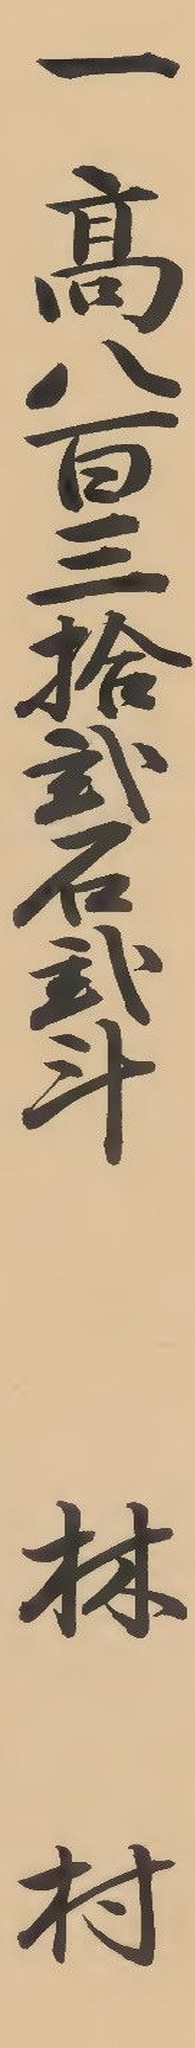一高八百三拾弐石弐斗林村
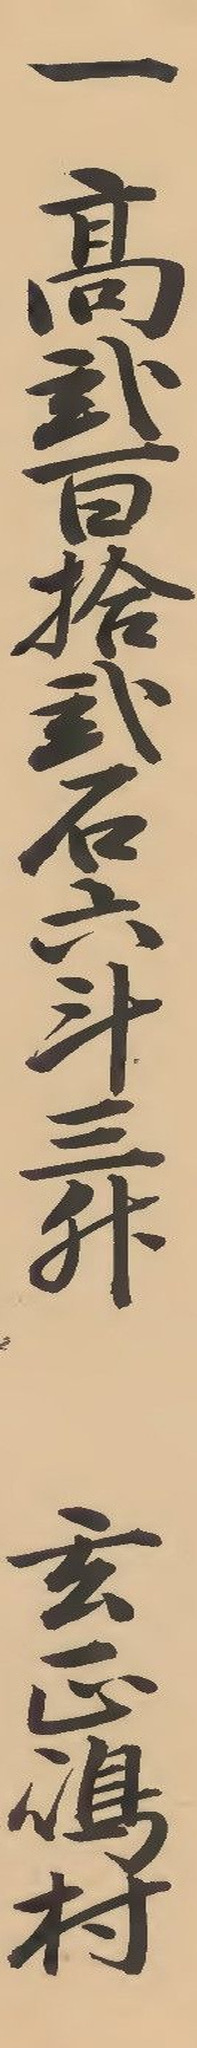一高弐百拾弐石六斗三升玄正島村
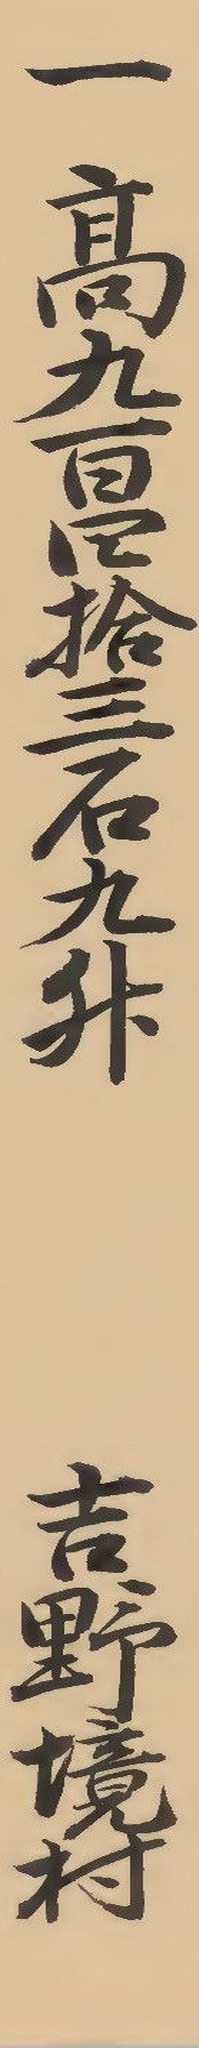一高九百四拾三石九升吉野境村
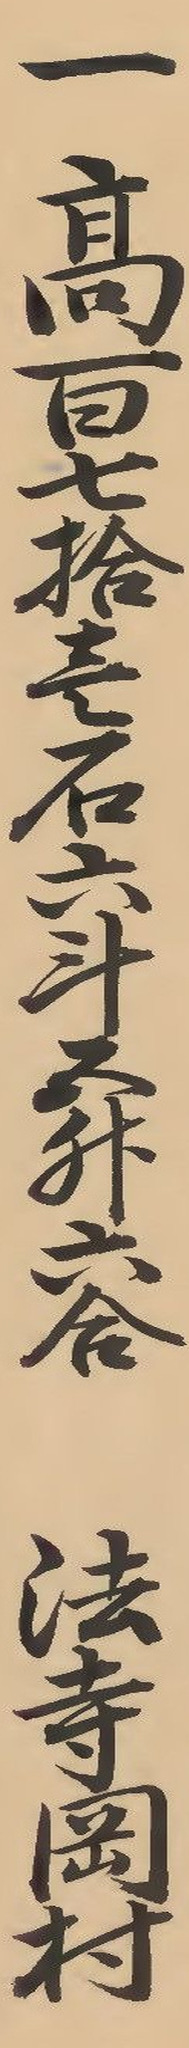一高百七拾壱石六斗五升六合法寺岡村
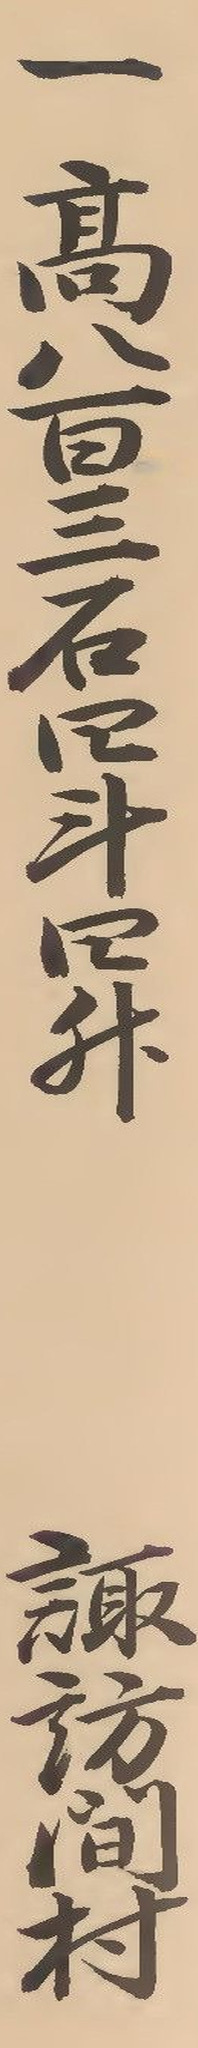一高八百三石四斗四升諏訪間村
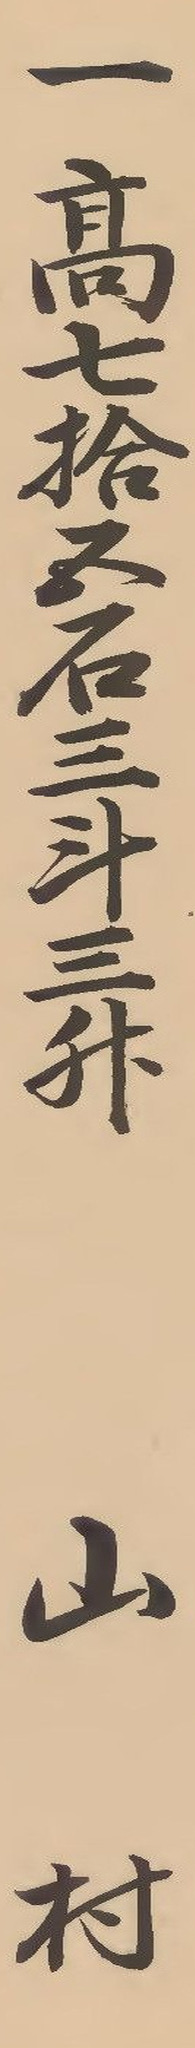一高七拾五石三斗三升山村
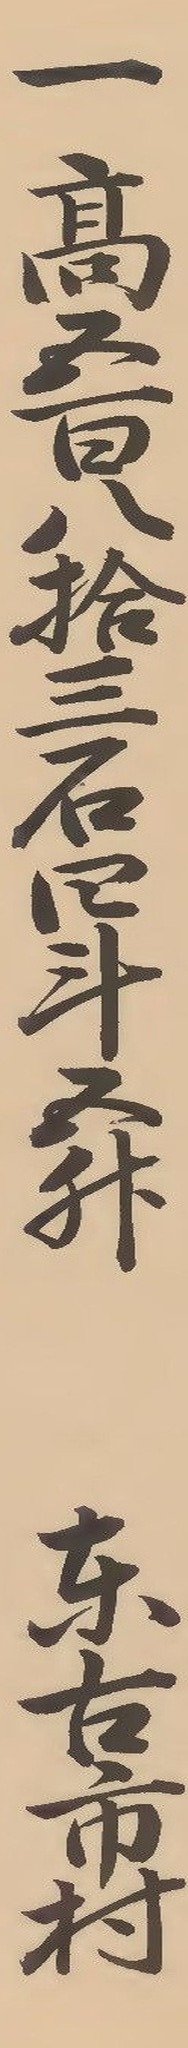一高五百八拾三石四斗五升東古市村
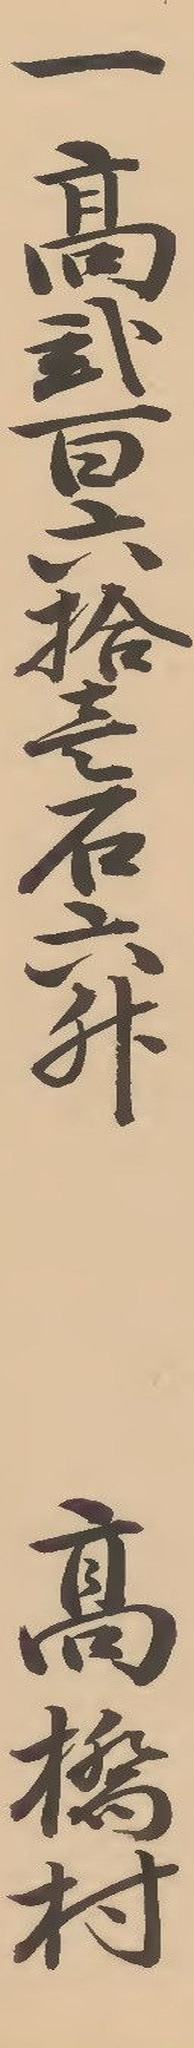一高弐百六拾壱石六升高橋村

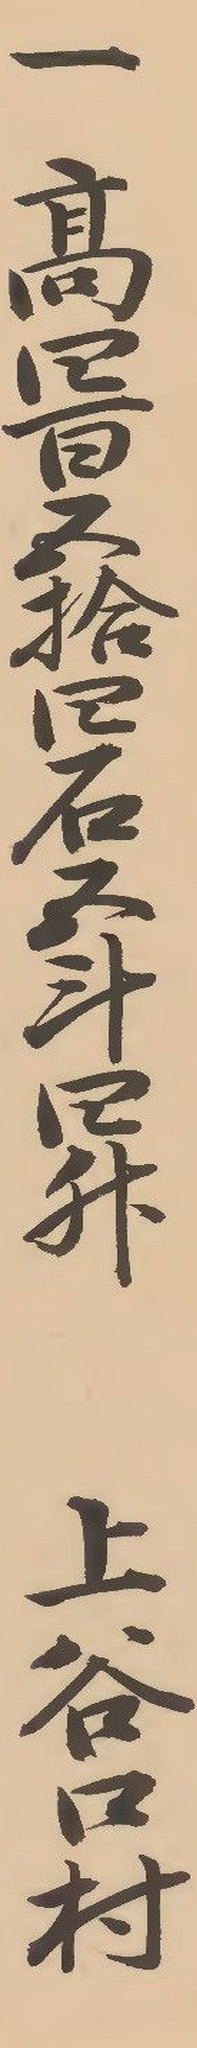一高四百五拾四石五斗四升上谷口村
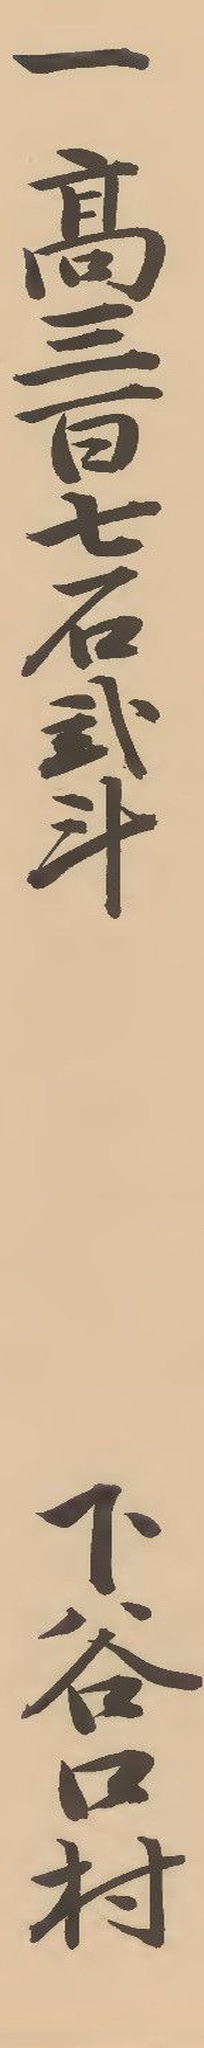一高三百七石弐斗下谷口村
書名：越前国郷帳
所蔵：国立公文書館 National Archives of Japan
